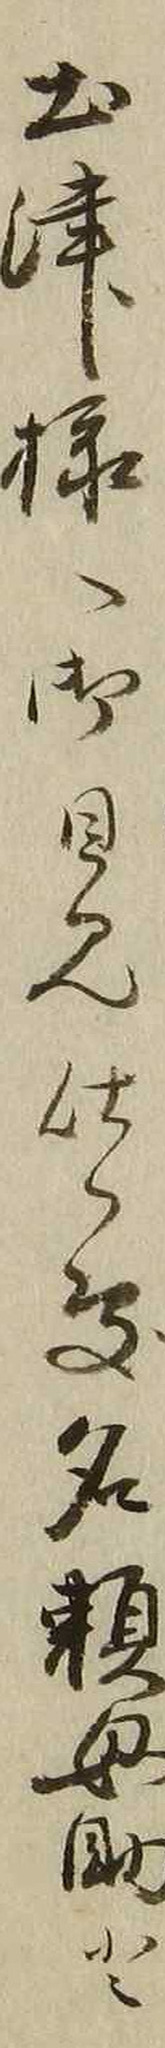土津様へ御目見仕候処名賴母助と
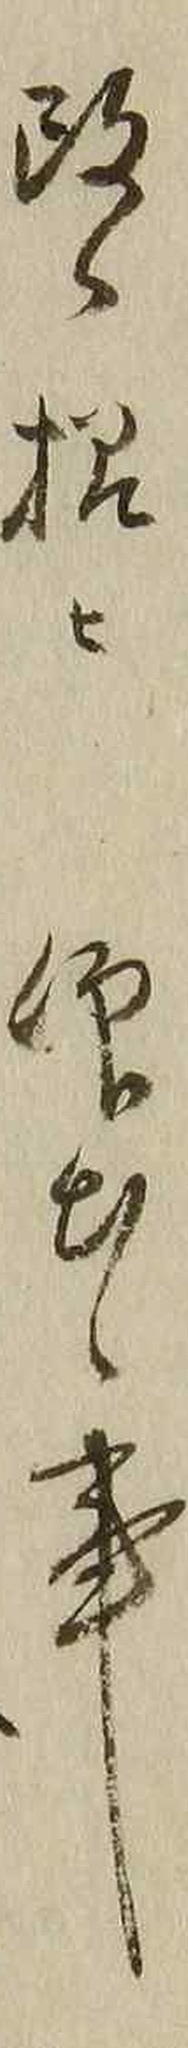改候様被仰出候事
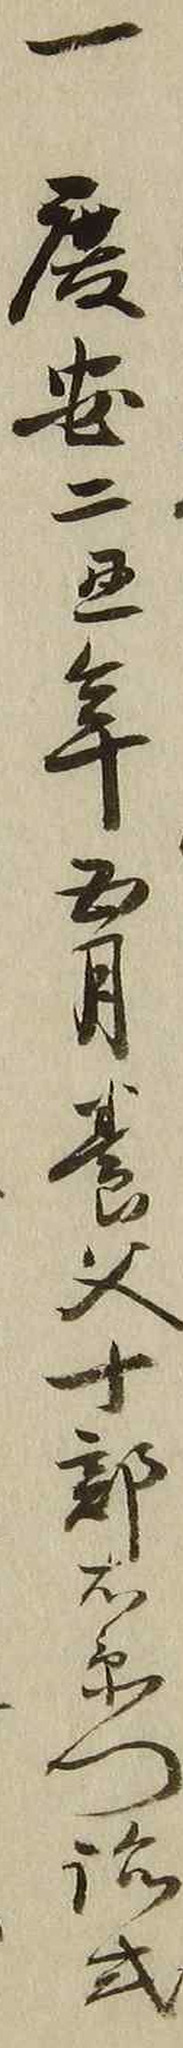一慶安二丑年五月養父十郎右衛門跡式
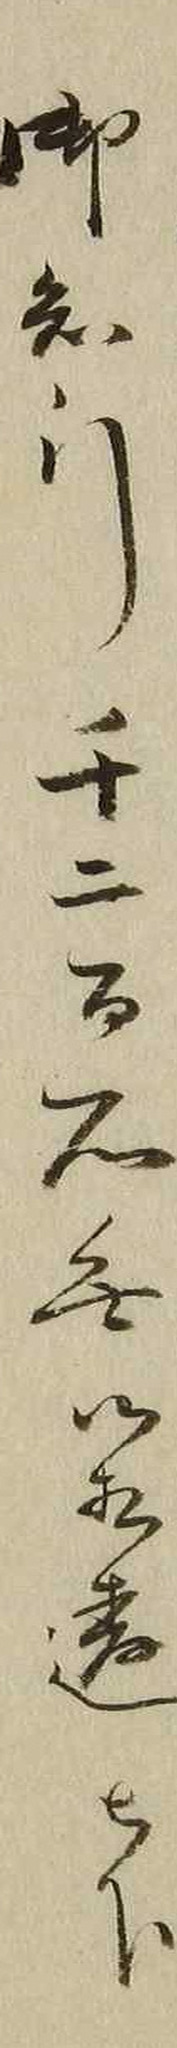御知行千二百石無御相違被下
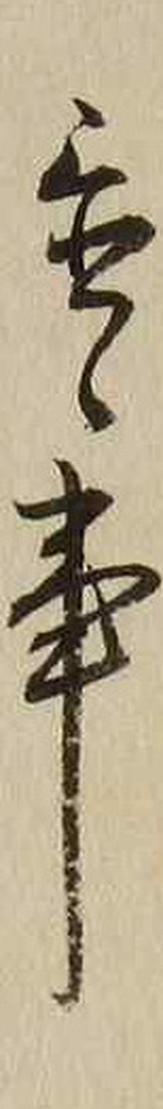置候事
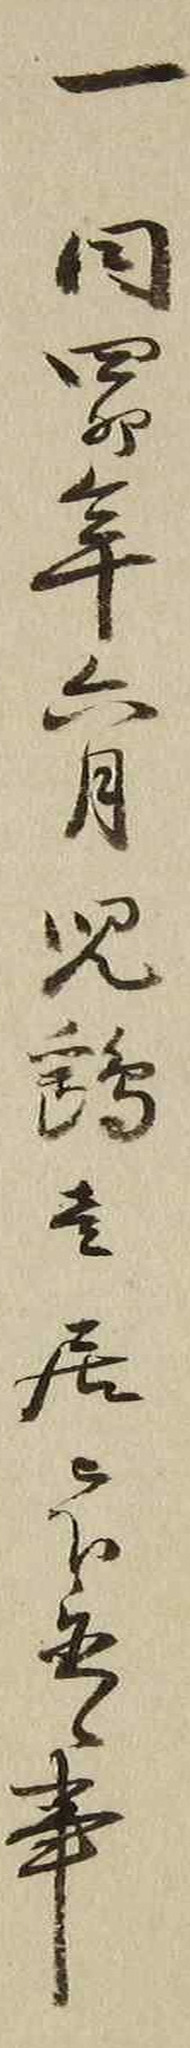一同四卯年六月児鶏壱居被下置候事
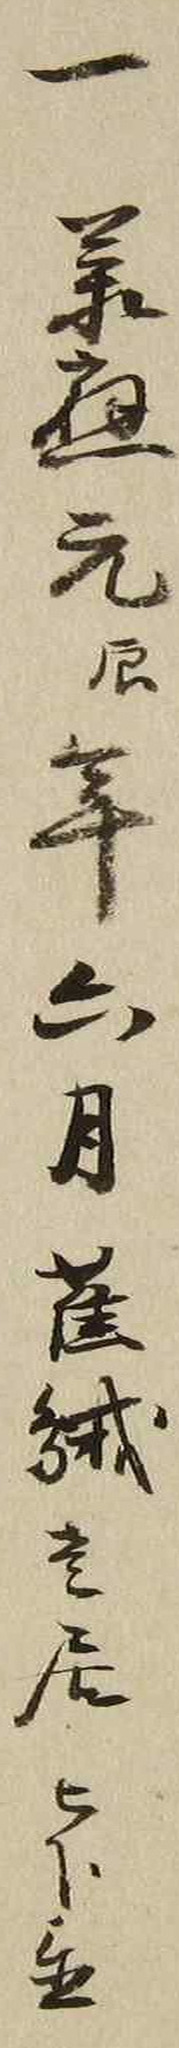一承応元辰年六月雀壱居被下置
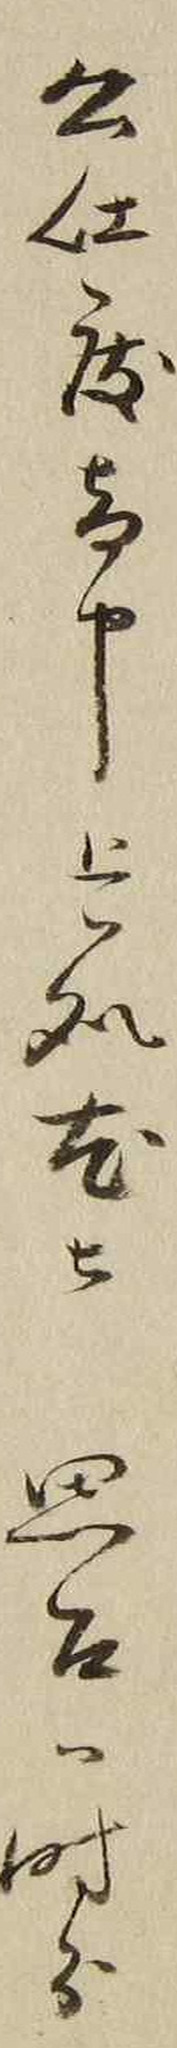公仕度旨申上候処尤被思召一時分
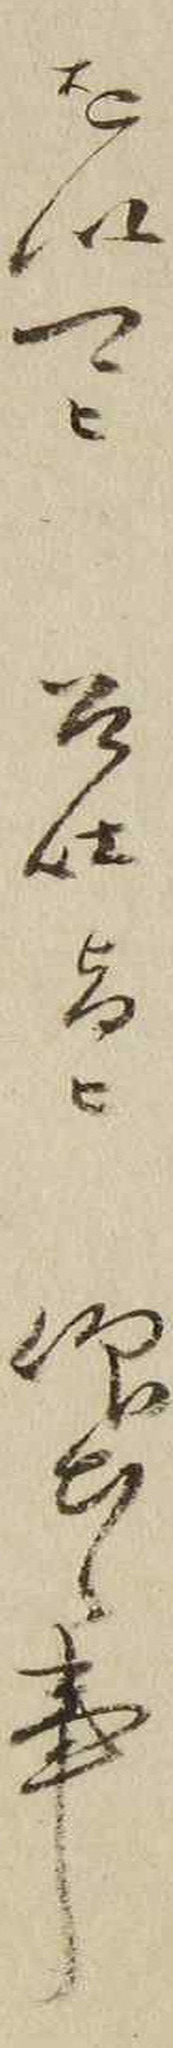を以可被召仕旨被仰出候事
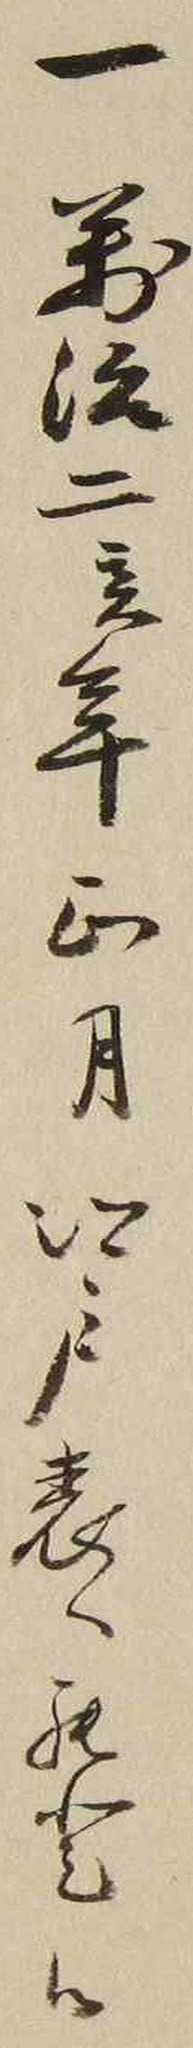一万治二亥年正月江戸表へ罷登候
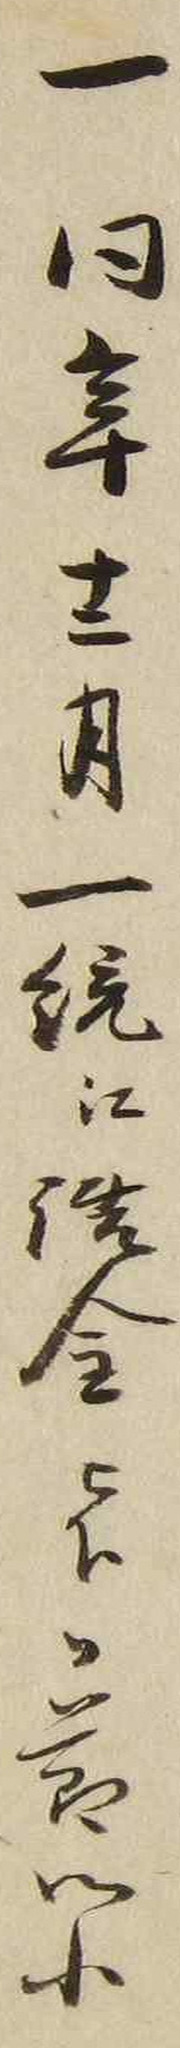一同年十二月一統江催金被下候節御小

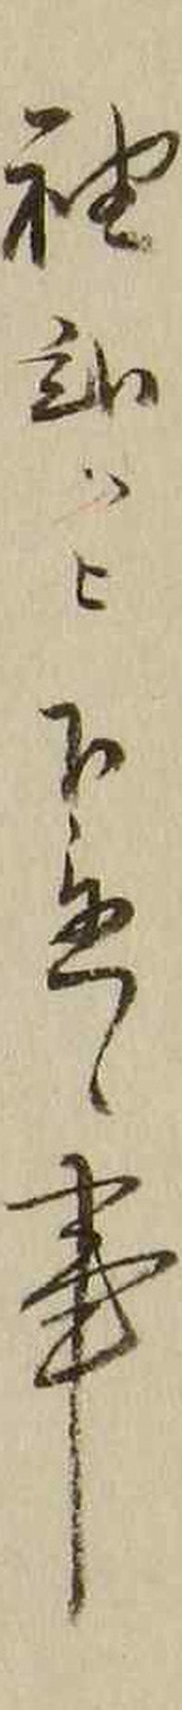袖弐つ被下置候事
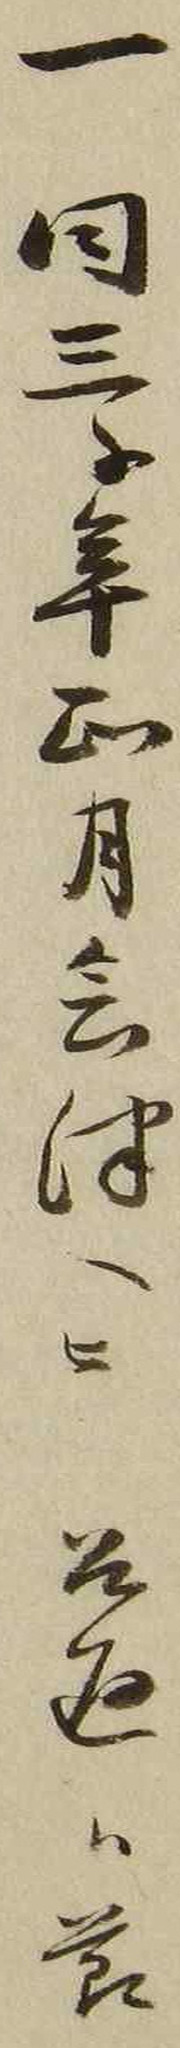一同三子年正月会津へ被召返候節
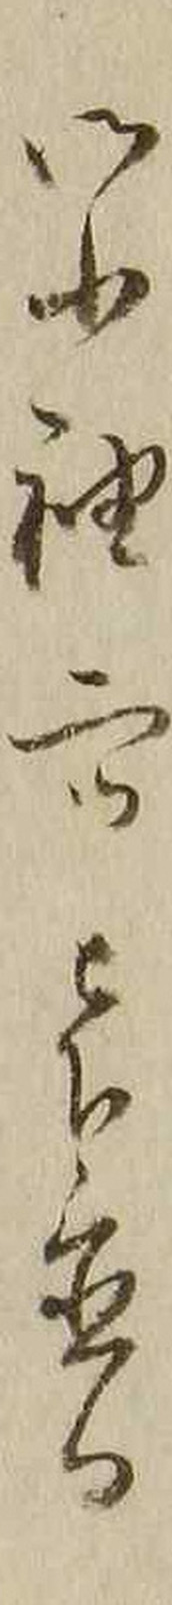御小袖二つ被下置候
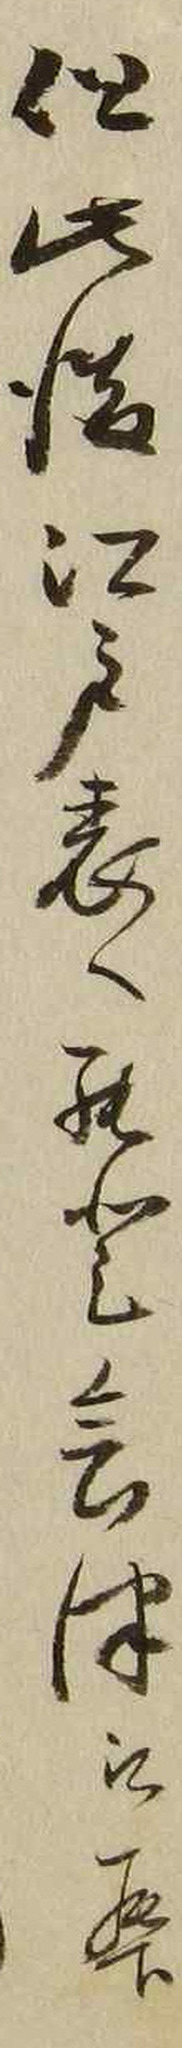但此後江戸表へ罷登会津江罷下
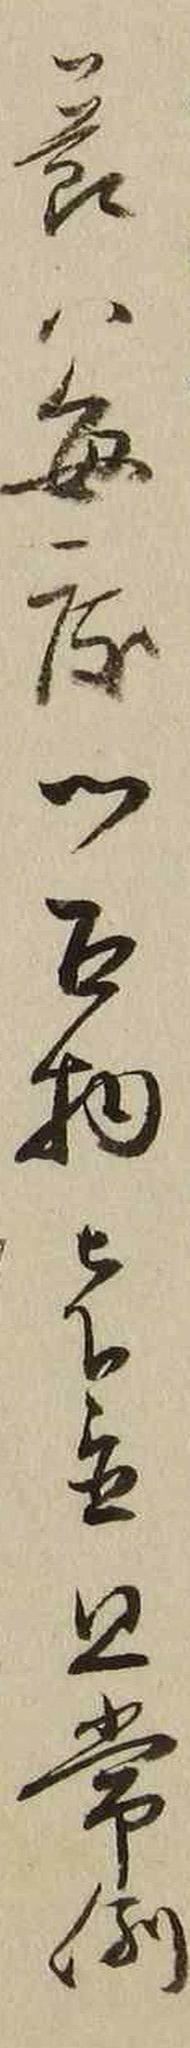候節は毎度御召物被下置且常例
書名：諸士系譜　巻之269　さ之部1
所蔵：会津若松市立会津図書館
